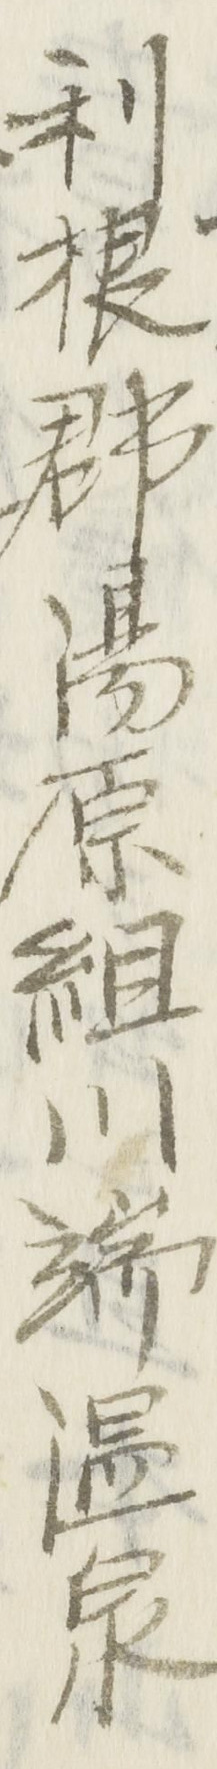利根郡湯原組川端温泉
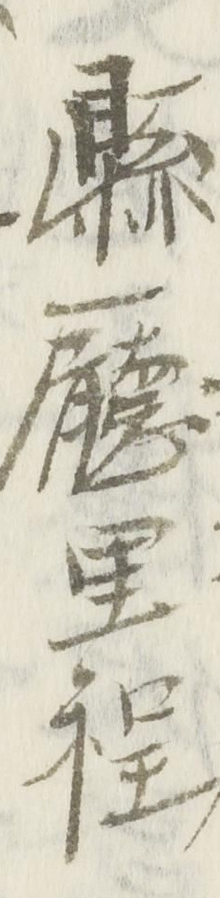県庁里程
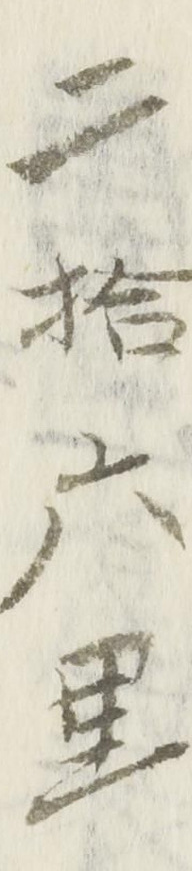二拾六里
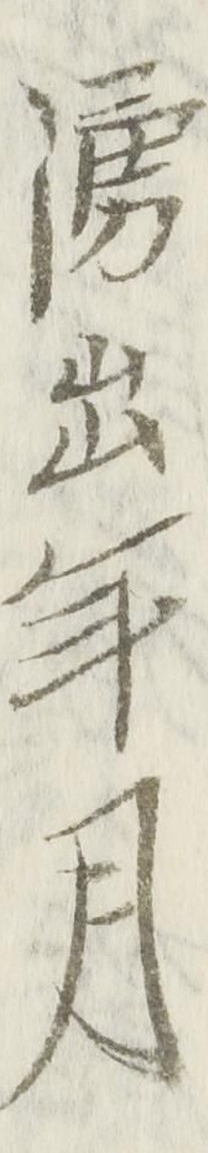湧出年月
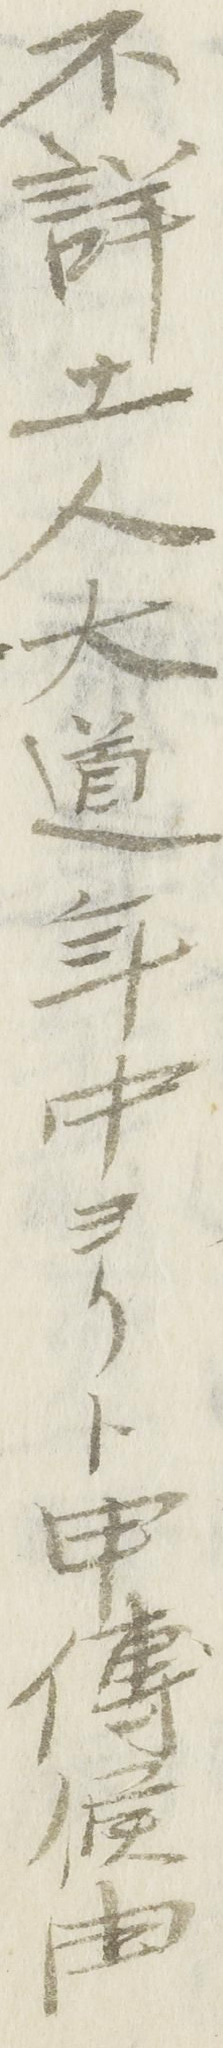不詳土人大道年中ヨリト申伝候由

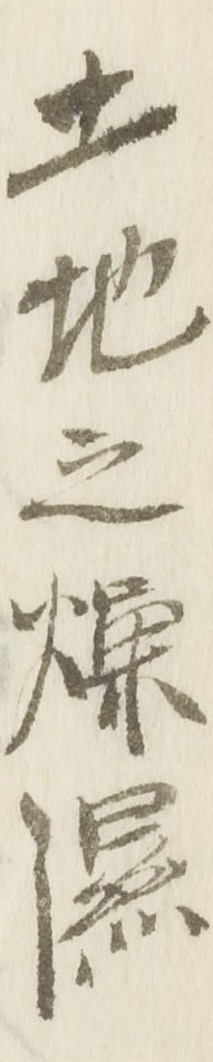土地之燥湿
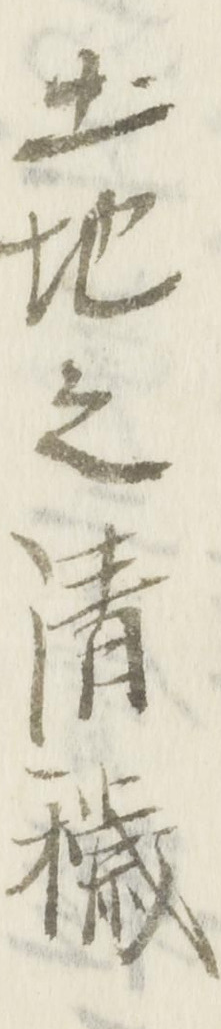土地之清穢
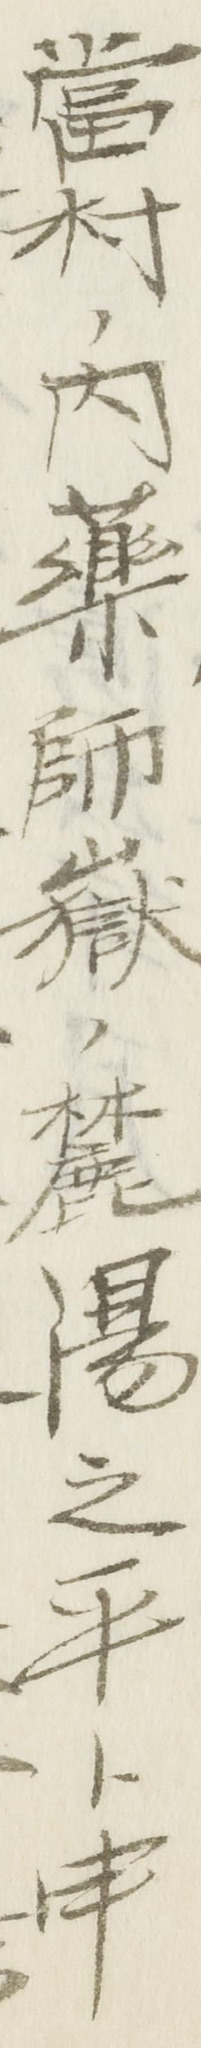当村ノ内薬師嶽ノ麓湯之平ト申
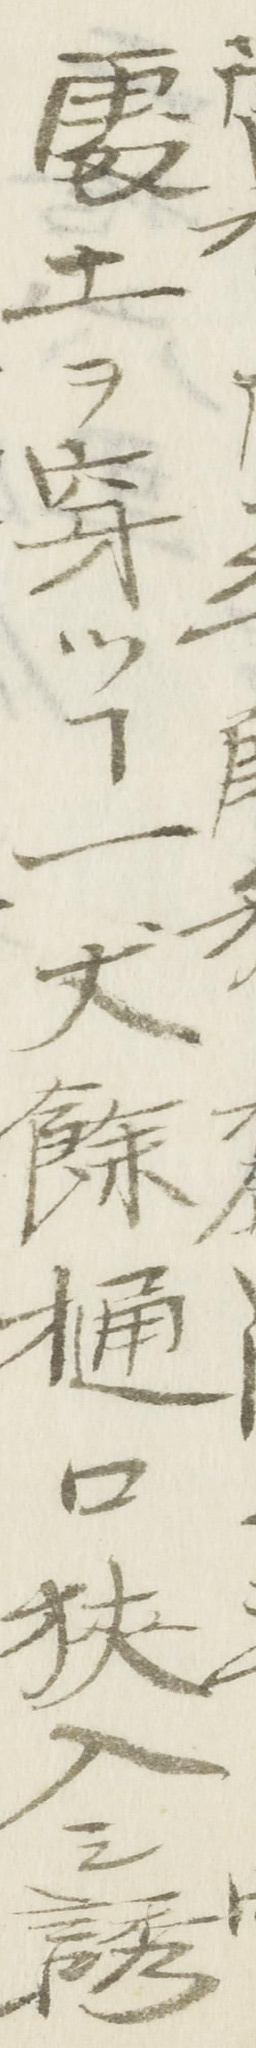処土を穿ツテ一丈餘樋口挟入シ誘
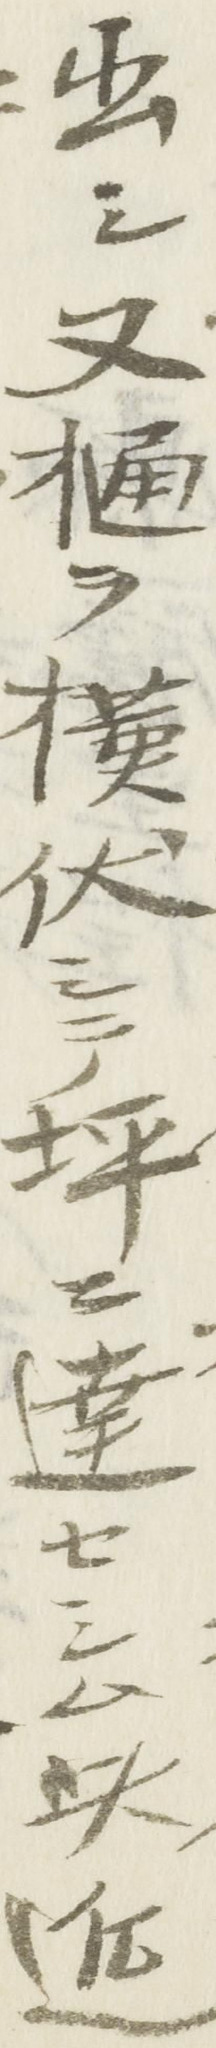出シ又樋ヲ横伏シテ坪ニ達セシム此近
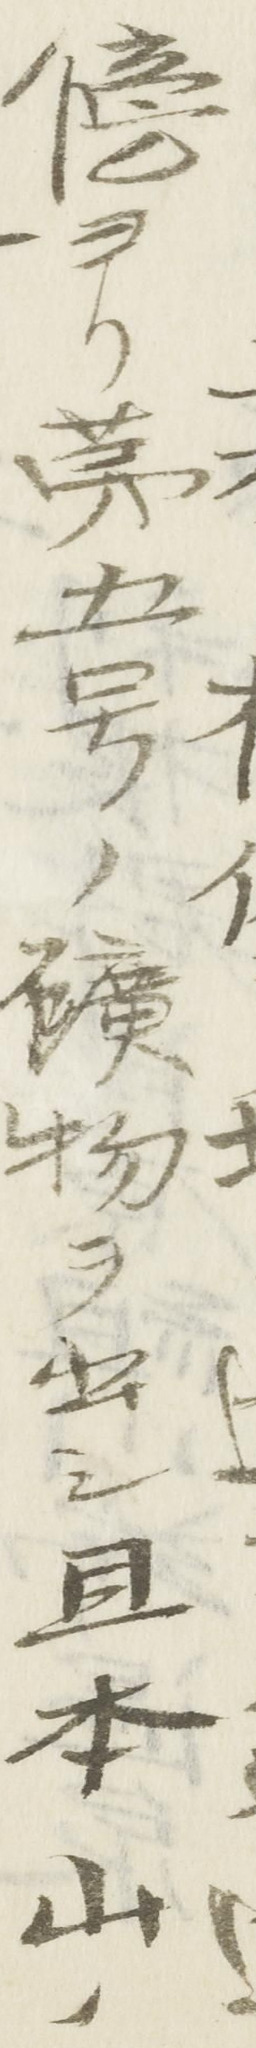傍ヨリ第五号ノ鉱物ヲ出シ且本山ノ
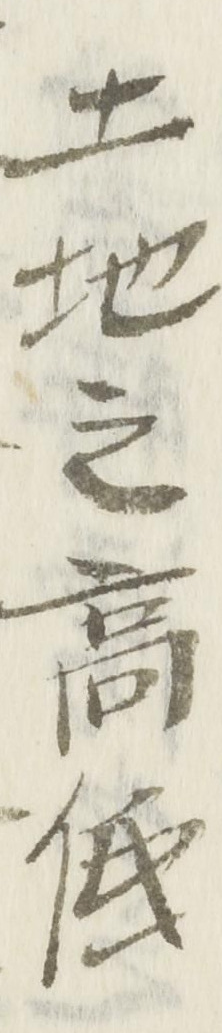土地之高低
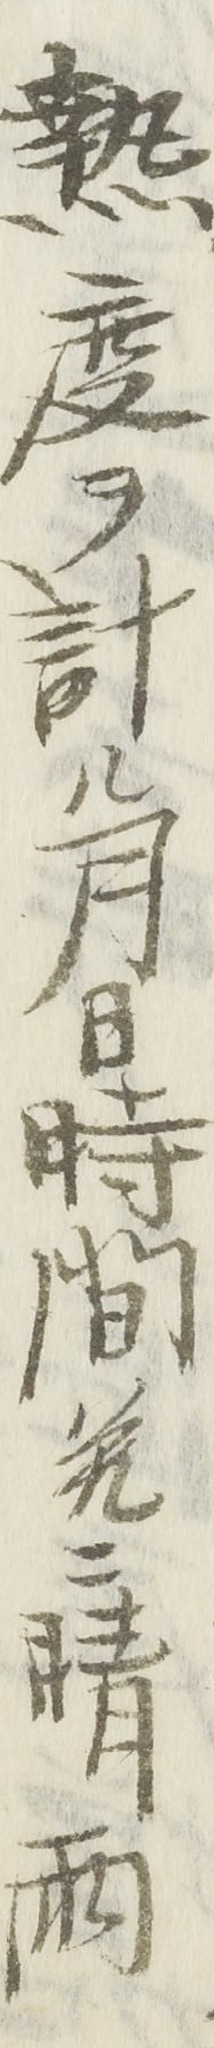熱度ヲ計ル月日時間并晴雨
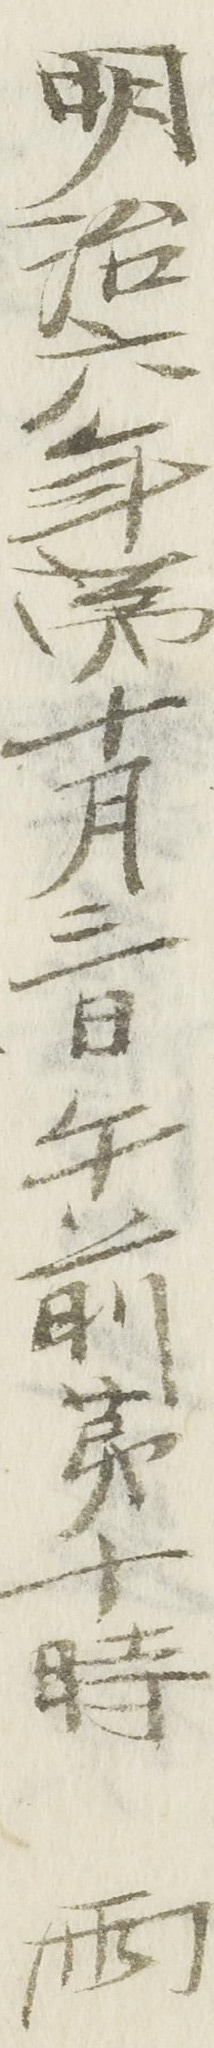明治六年第十月三日午前第十時雨
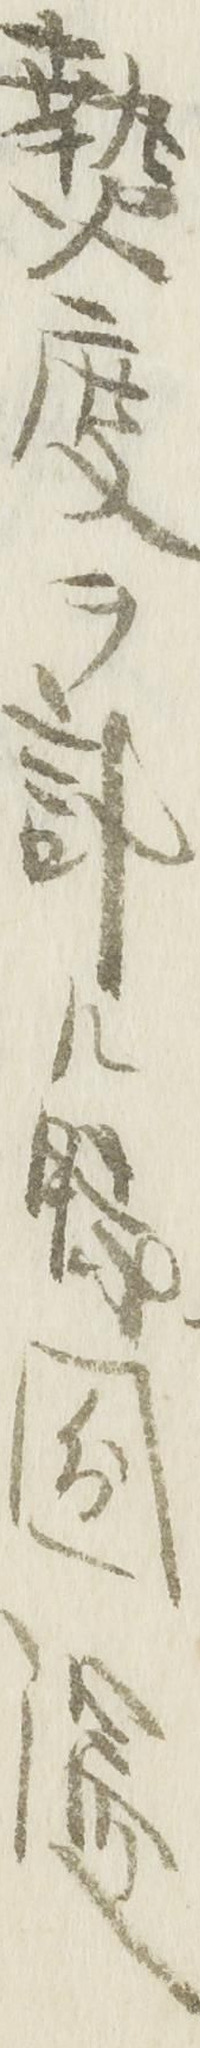熱度ヲ計ル時分温
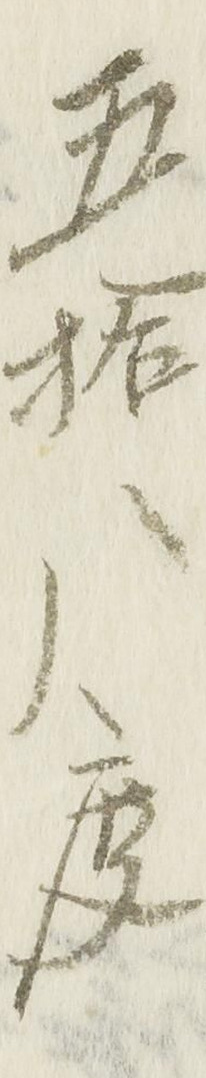五拾ハ度
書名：温冷泉試験表
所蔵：東京大学地震研究所図書室 Earthquake Research Institute Library, The University of Tokyo, JAPAN
